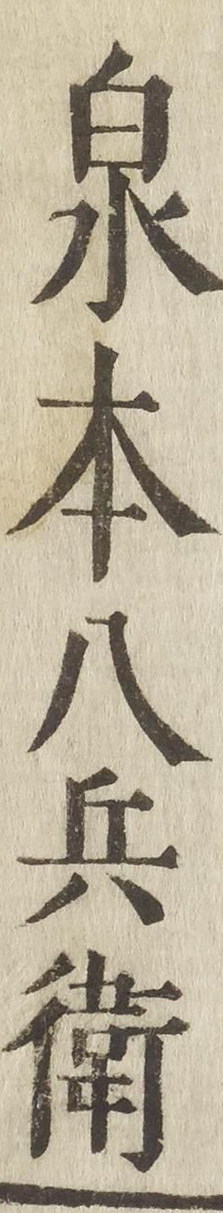泉本八兵衛
